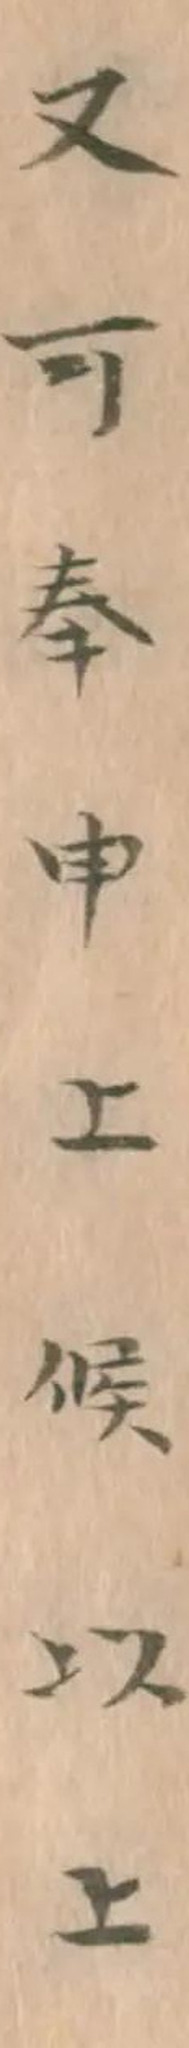又可奉申上候以上
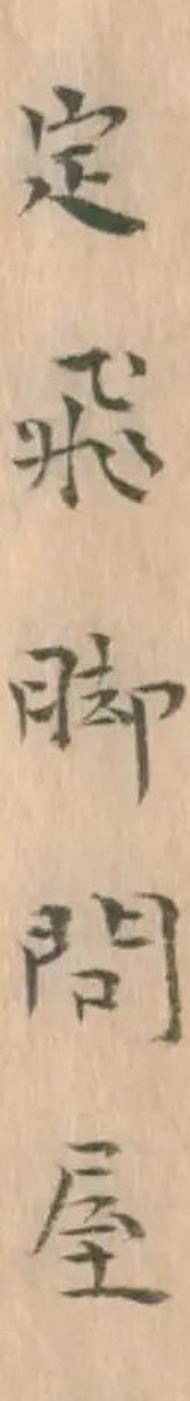定飛脚問屋
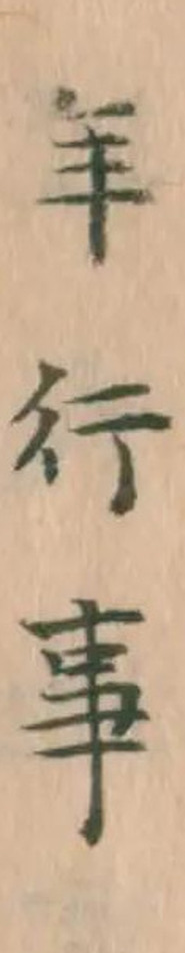年行事
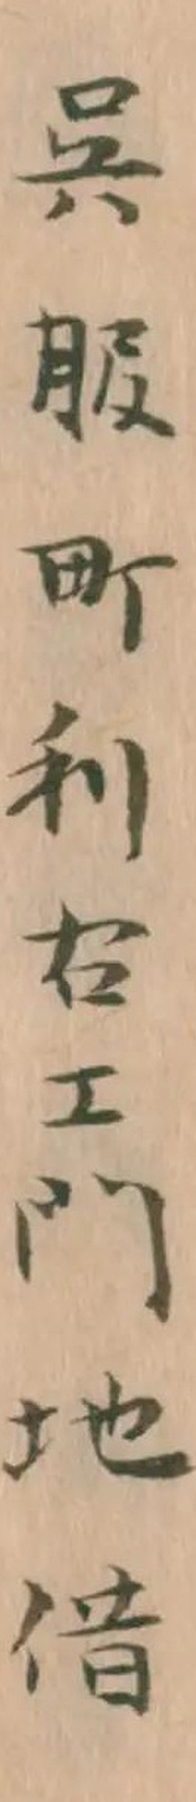呉服町利右衛門地借
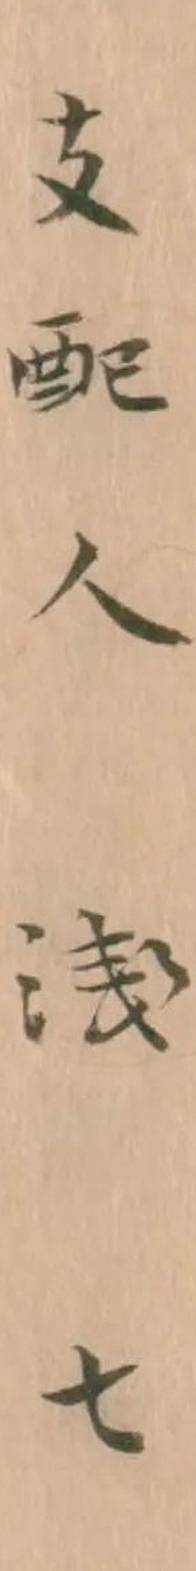支配人浅七
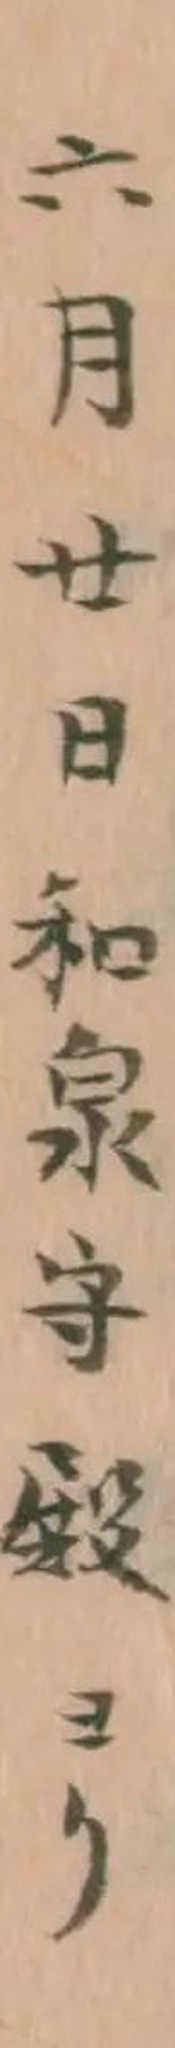六月廿日和泉守殿ヨリ
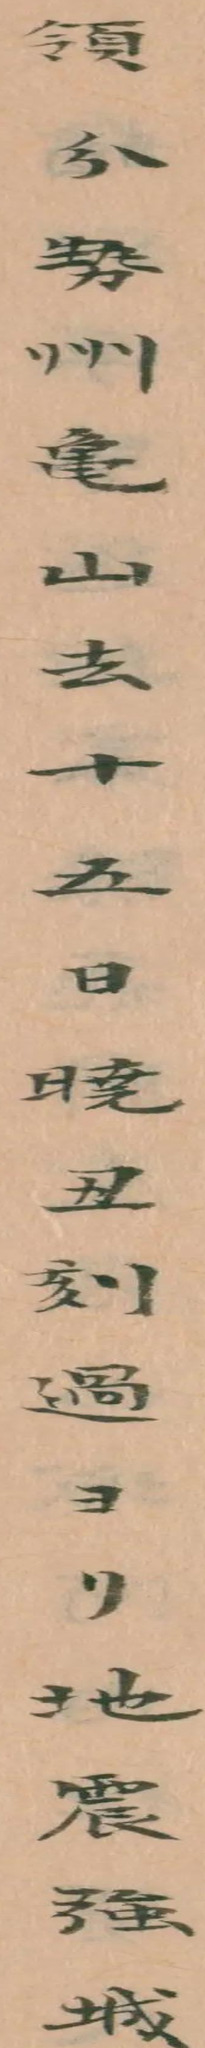領分勢州亀山去十五日暁丑刻過ヨリ地震強城
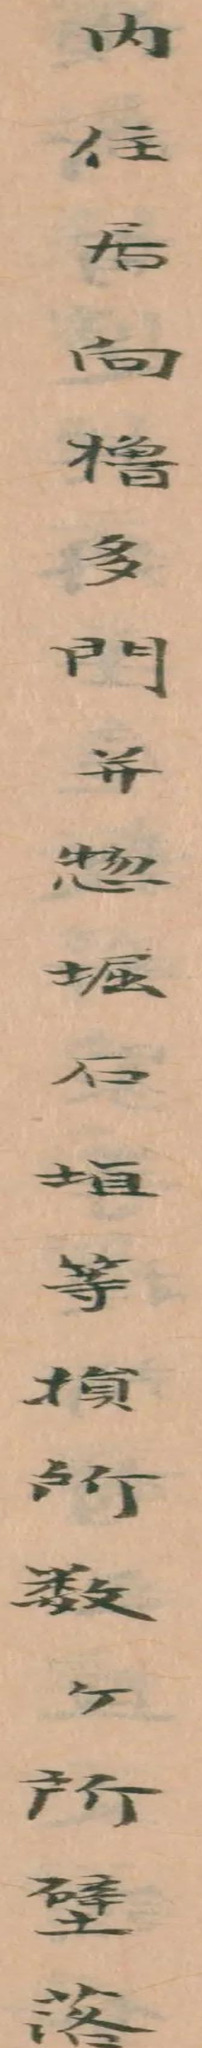内住居向櫓多門并惣堀石垣等損所数ヶ所壁落
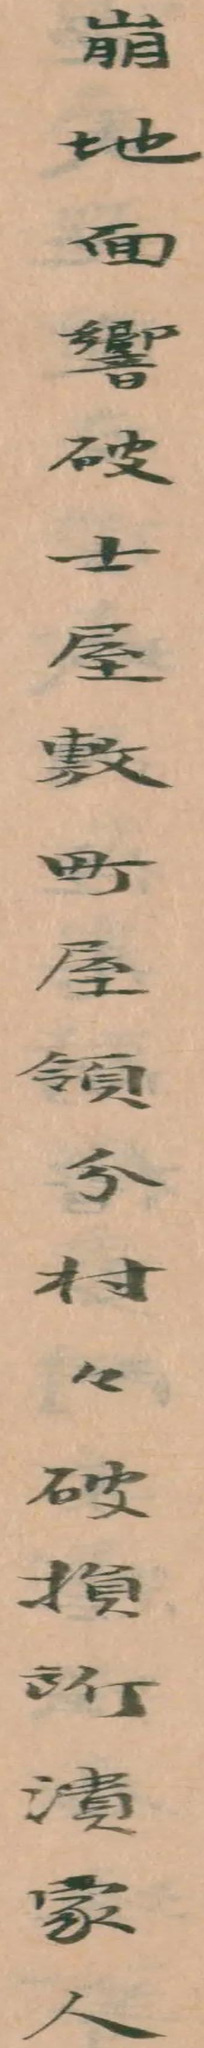崩地面響破士屋敷町屋領分村々破損所潰家人
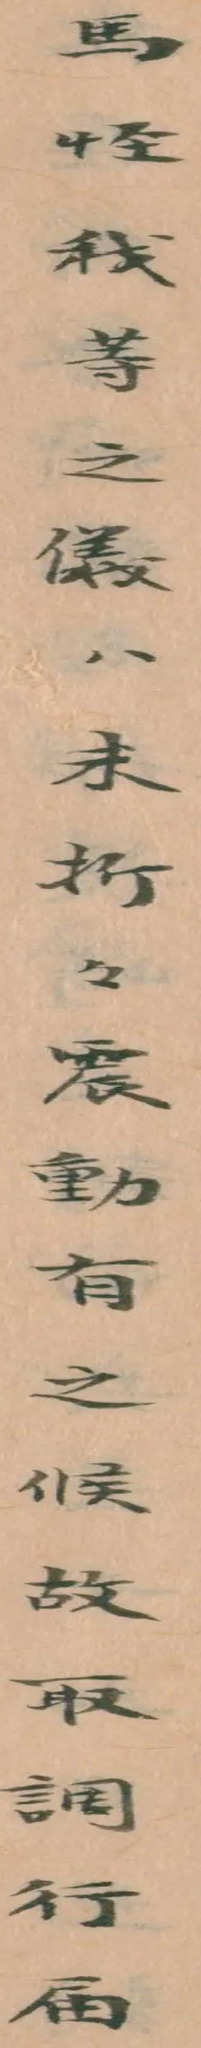馬怪我等之儀ハ未折々震動有之候故取調行届
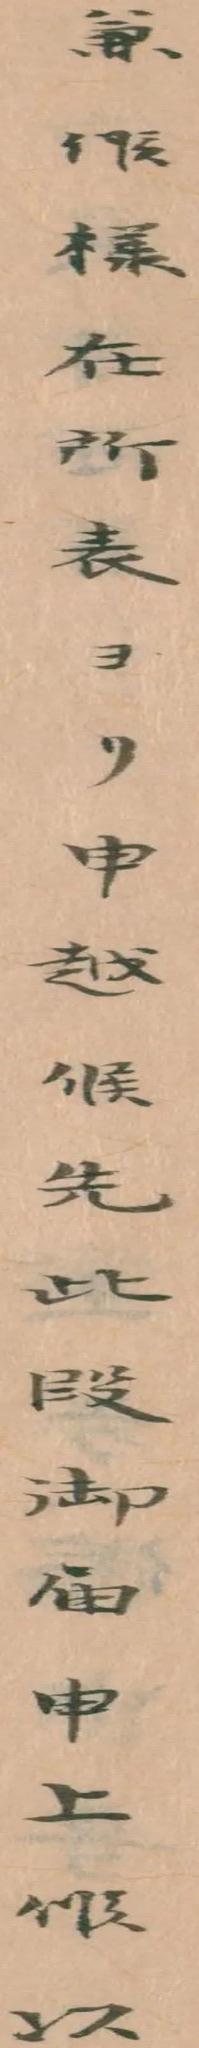兼候様在所表ヨリ申越候先此段御届申上候以
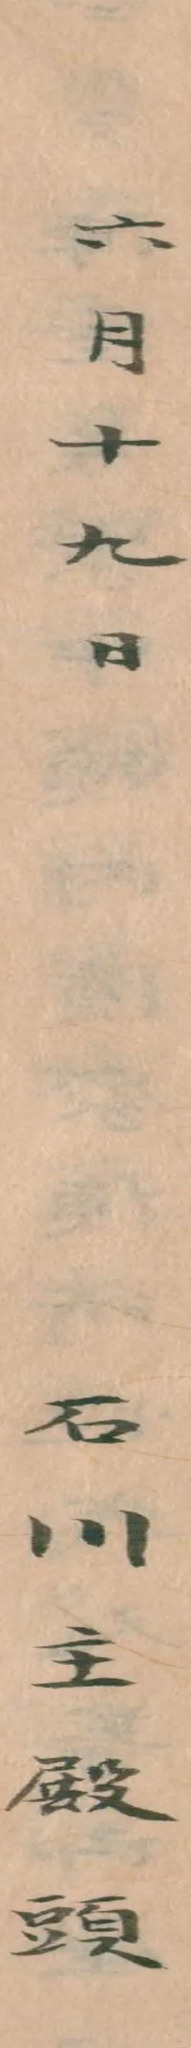六月十九日石川主殿頭
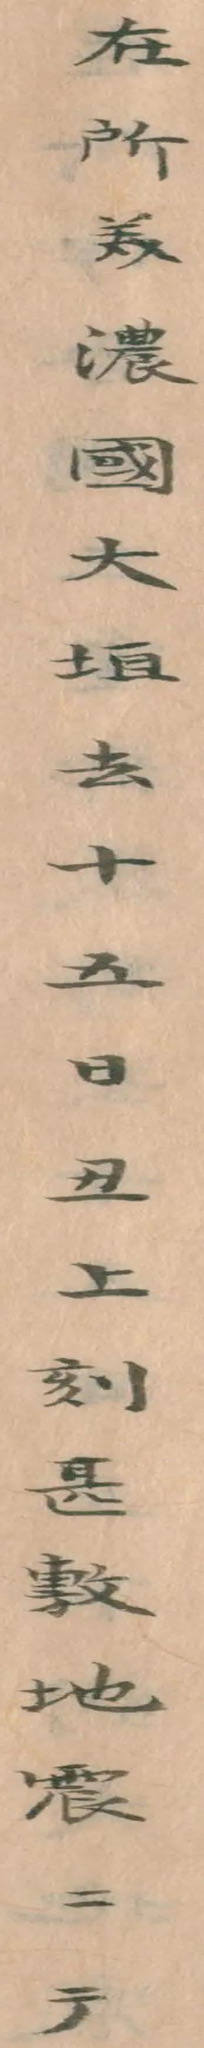在所美濃国大垣去十五日丑上刻甚敷地震ニテ
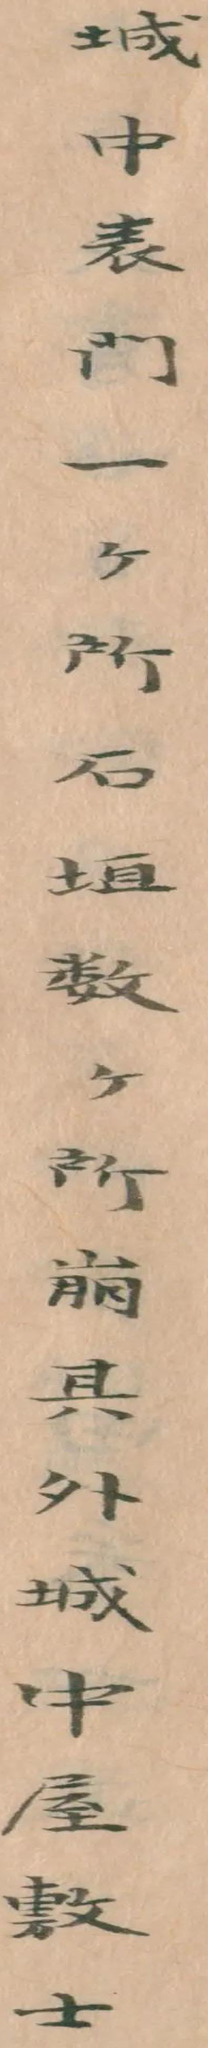城中表門一ヶ所石垣数ヶ所崩其外城中屋敷士
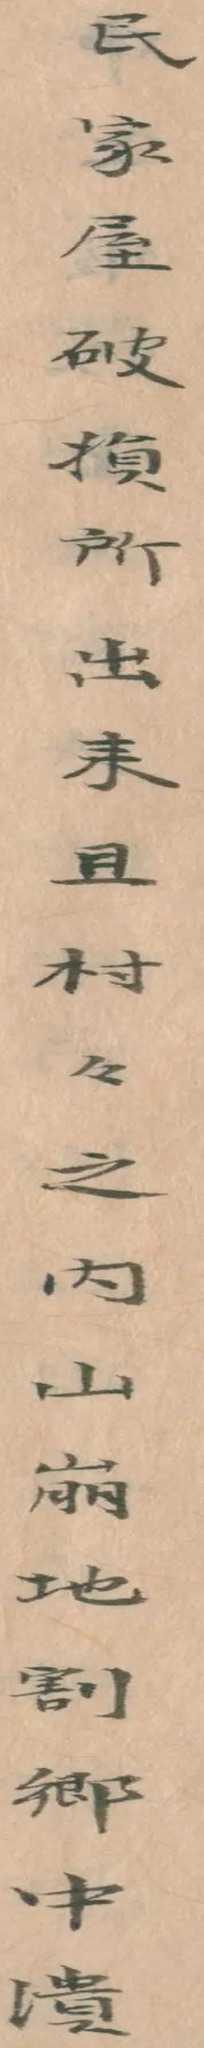民家屋は損所出来且村々之内山崩地割郷中潰
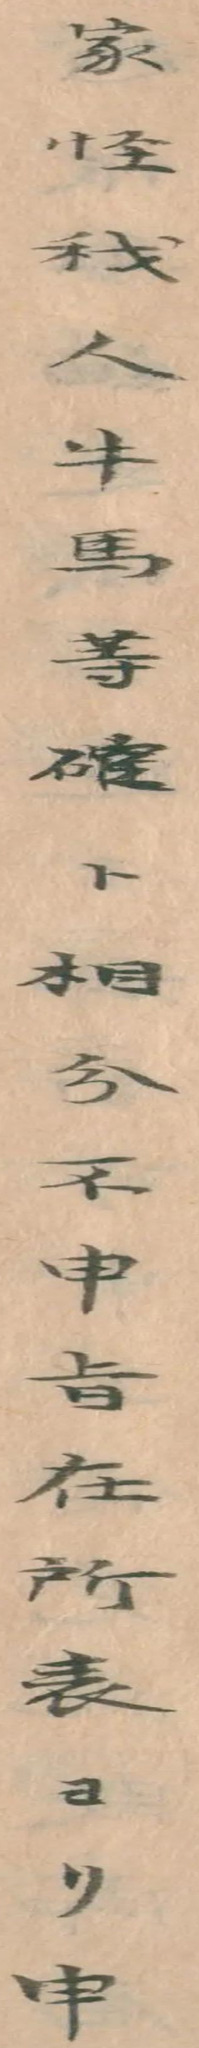家怪我人牛馬等碇ト相分不申旨在所表ヨリ申
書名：地災撮要. 巻1(噴火山・地震ノ部)
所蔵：国立国会図書館 National Diet Library, JAPAN
